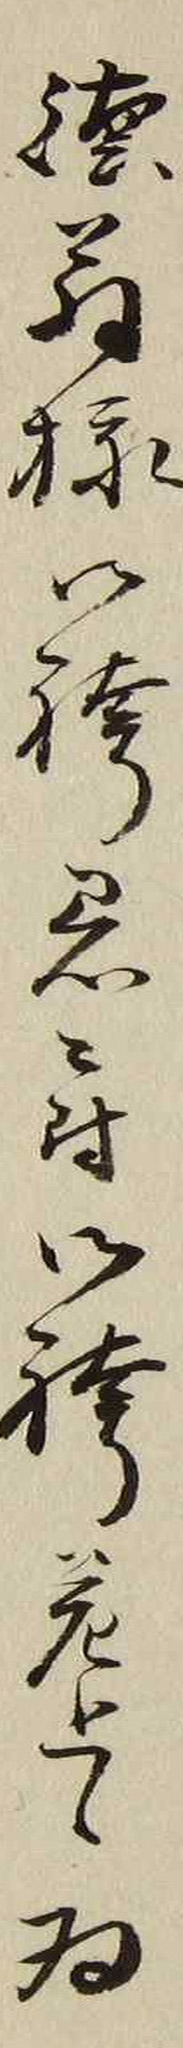徳翁様御袴着に付御袴差上候為
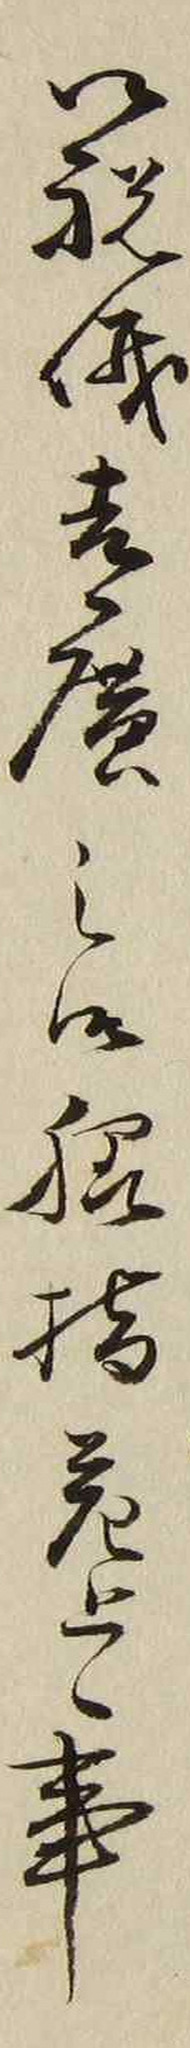御祝儀吉広之御脇差差上候事
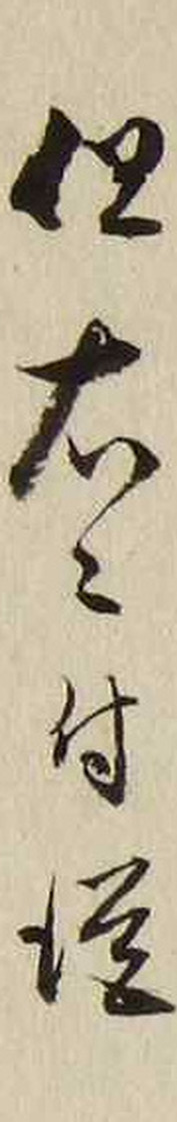但右に付従
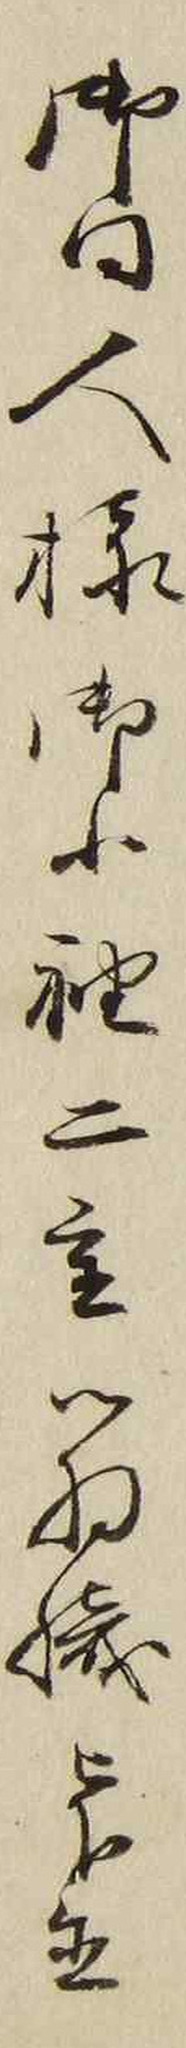御同人様御子袖二重御羽織被下置

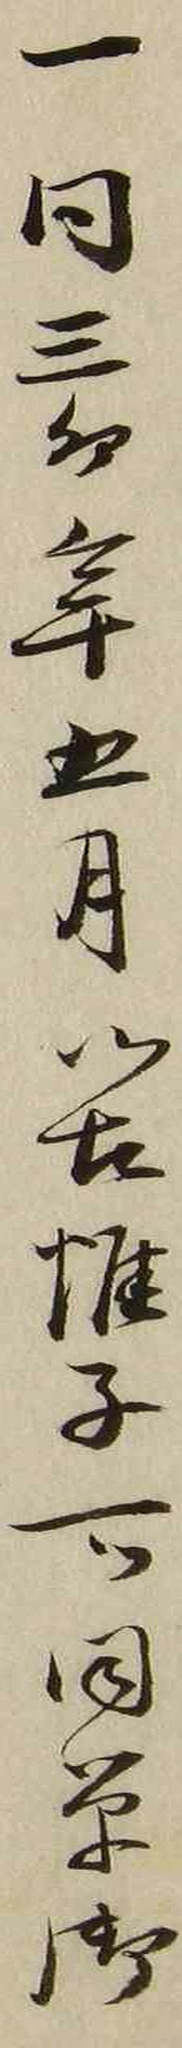一同三卯年五月御古帷子一つ同単御
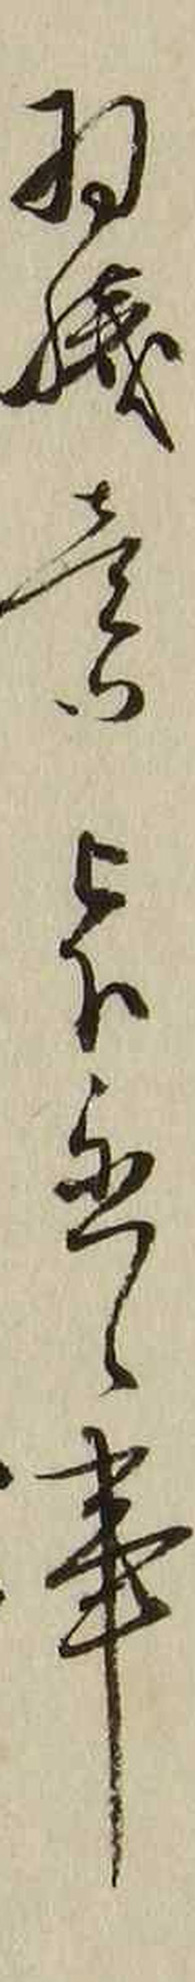羽織壱つ被下置候事
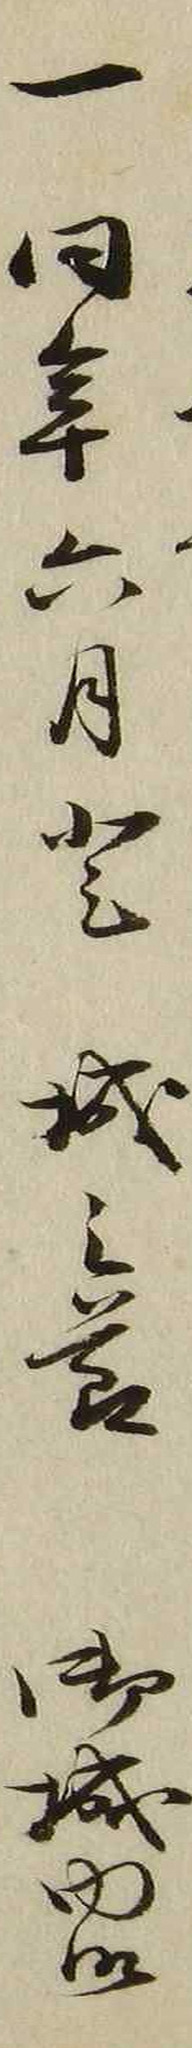一同年六月登城之節御城内御
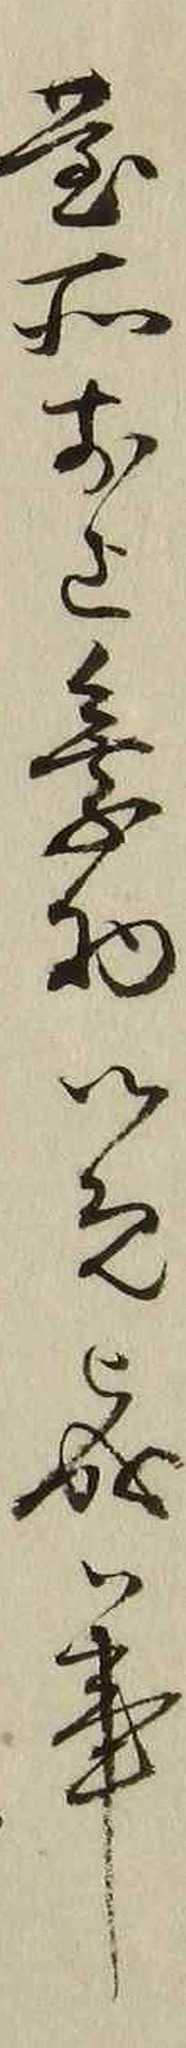台所前迄乗物御免被成候事
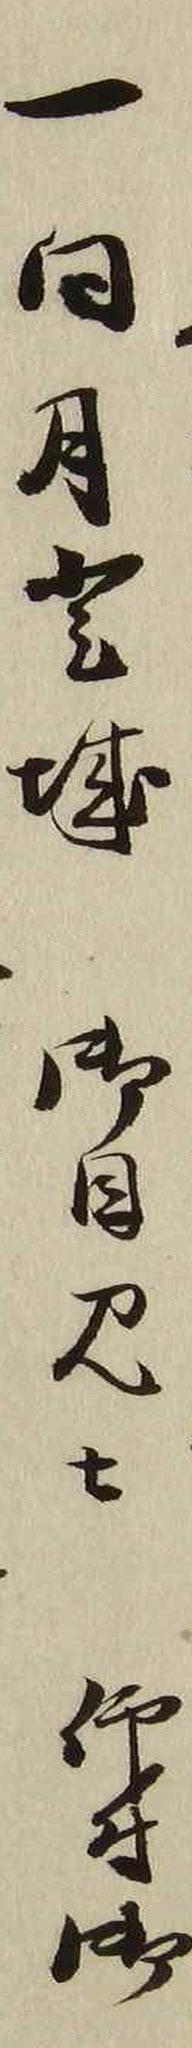一同月登城御目見被仰付御
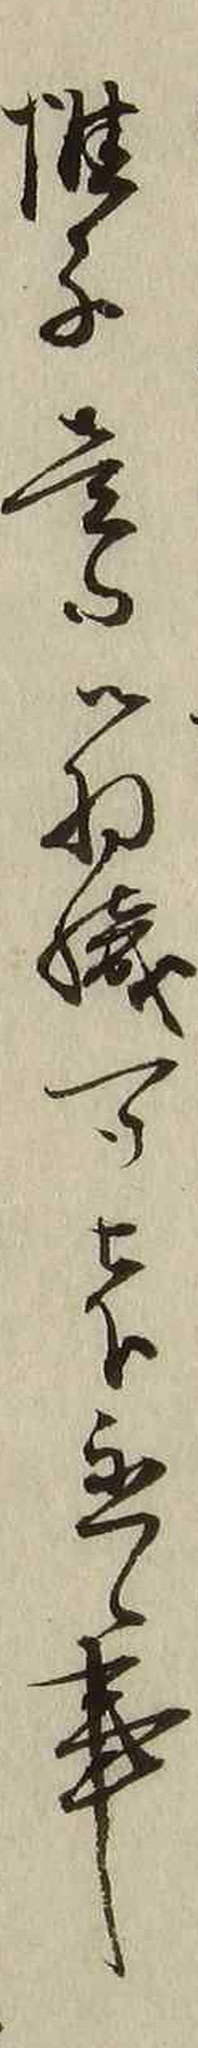帷子壱つ御羽織被下置候事
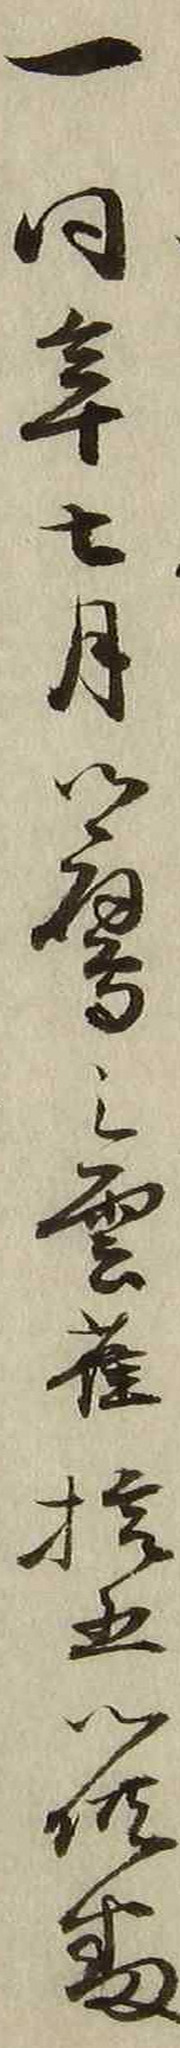一同年七月御鷹之雲雀拾五御供番
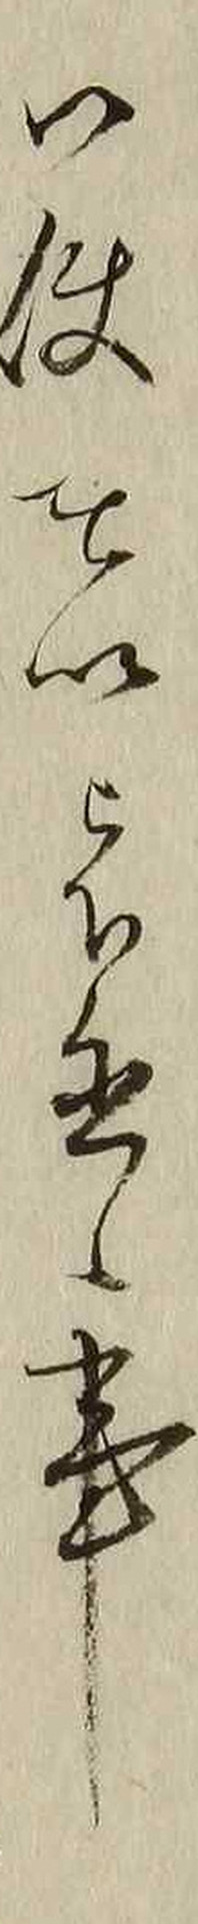御使を以被下置候事
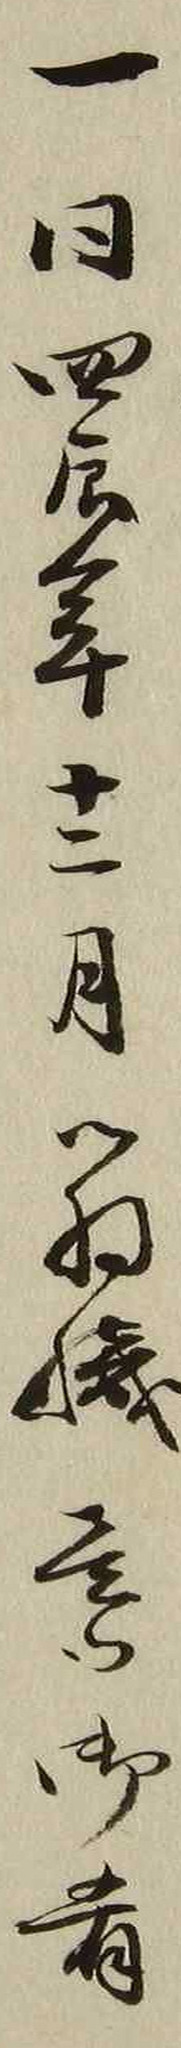一同四辰年十二月御羽織壱つ御肴
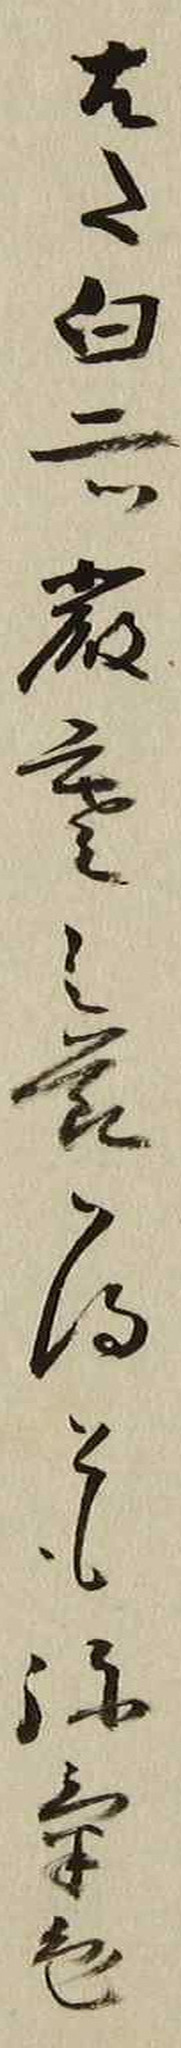はた白二つ厳寒之節に候得とも弥気色
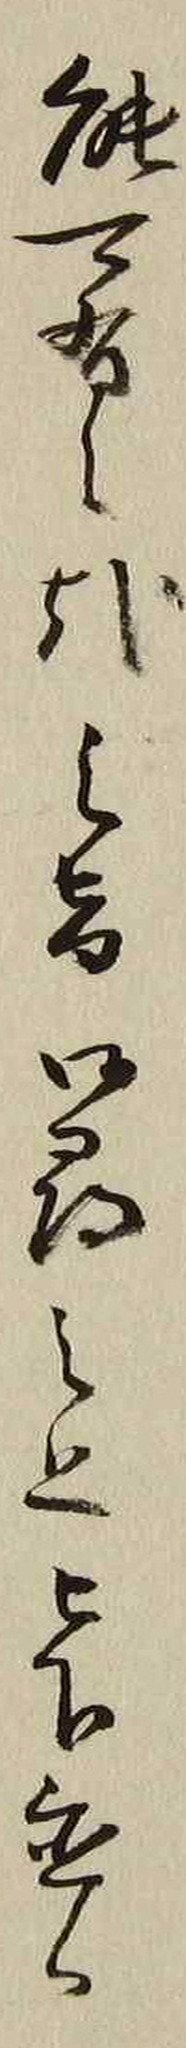能有之哉之旨御尋之上被下置候
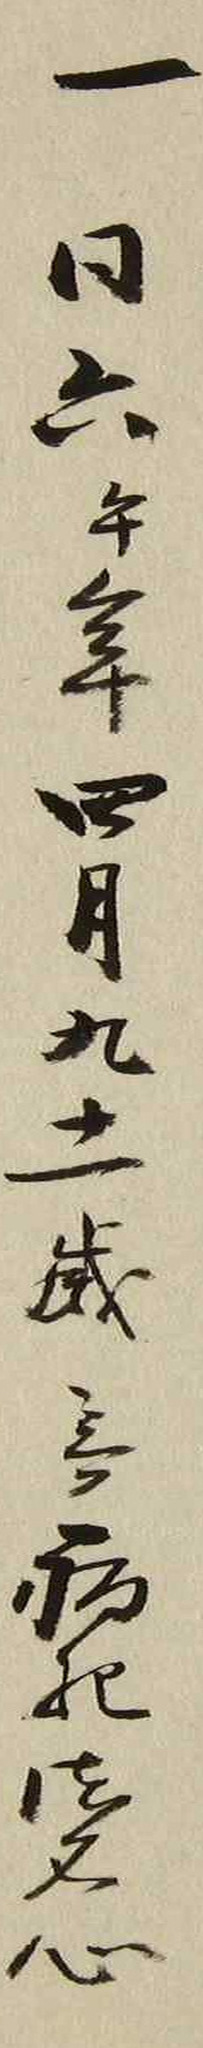一同六午年四月九十一歳に而病死法名心
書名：諸士系譜　巻之292　き之部1
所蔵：会津若松市立会津図書館
